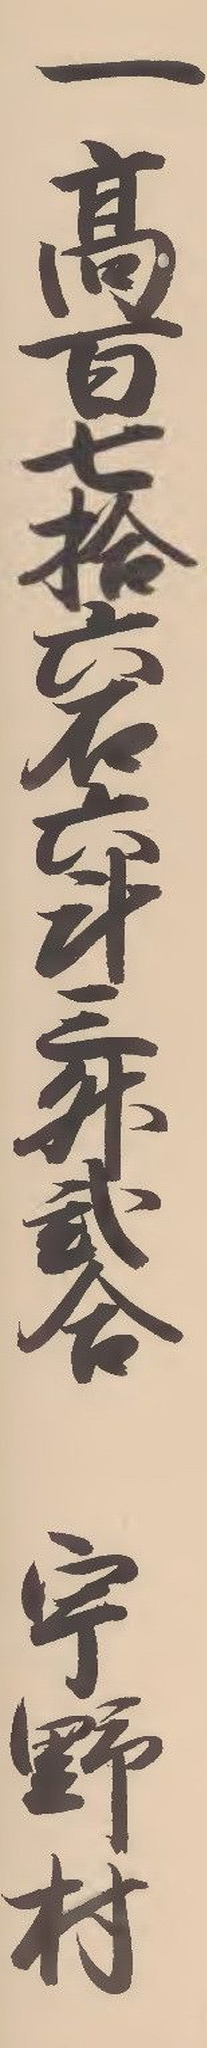一高百七拾六石六斗三升弐合宇野村
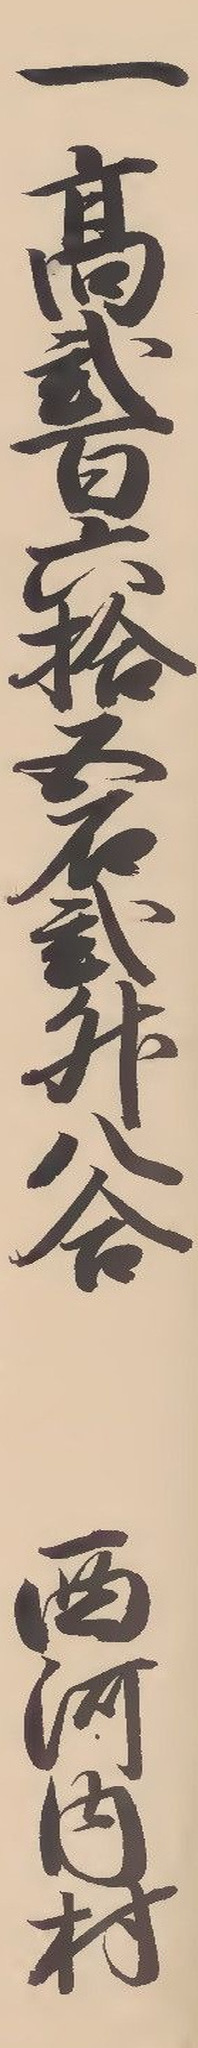一高弐百六拾五石弐升八合西河内村
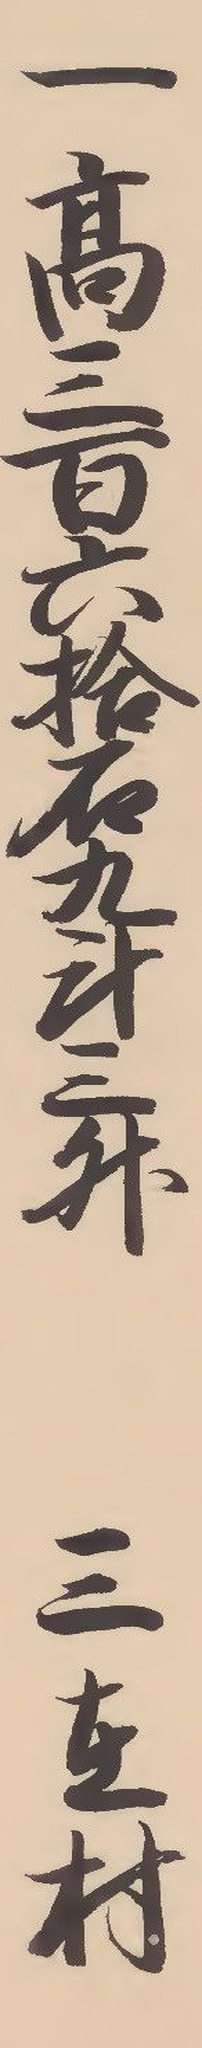一高三百六拾石九斗三升三在村
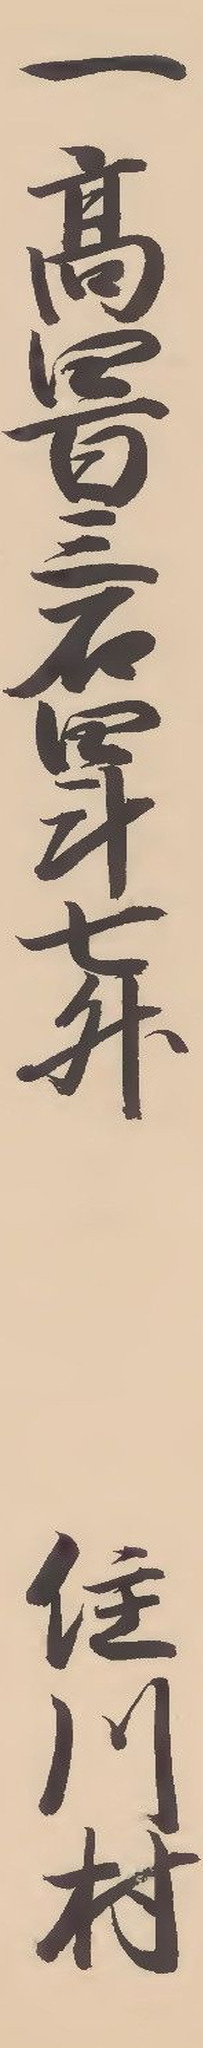一高四百三石四斗七升住川村

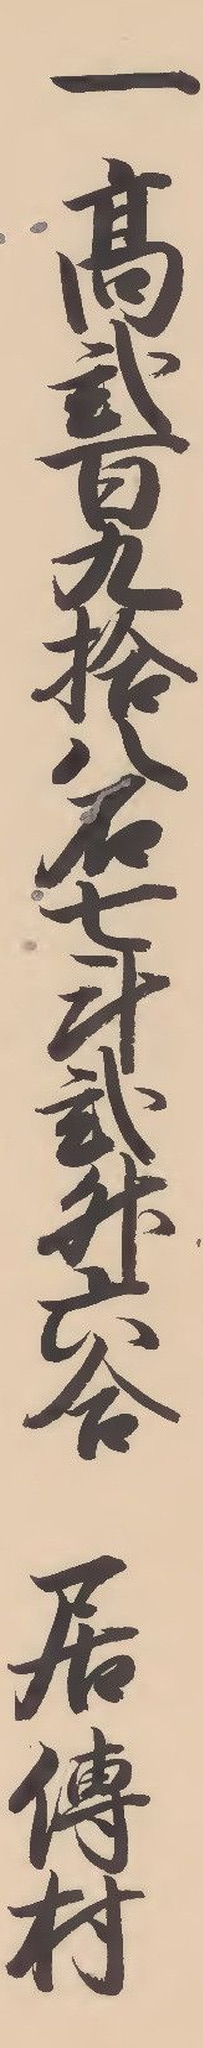一高弐百九拾八石七斗弐升六合居伝村
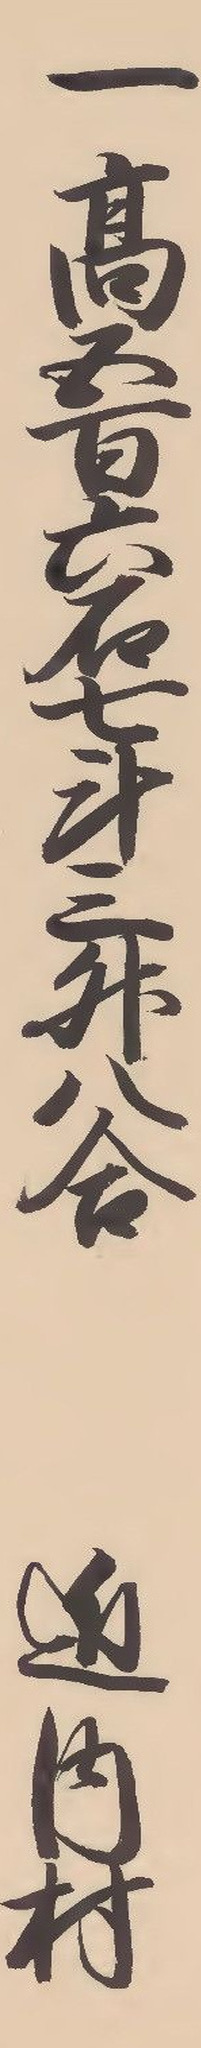一高五百六石七斗三升八合近内村
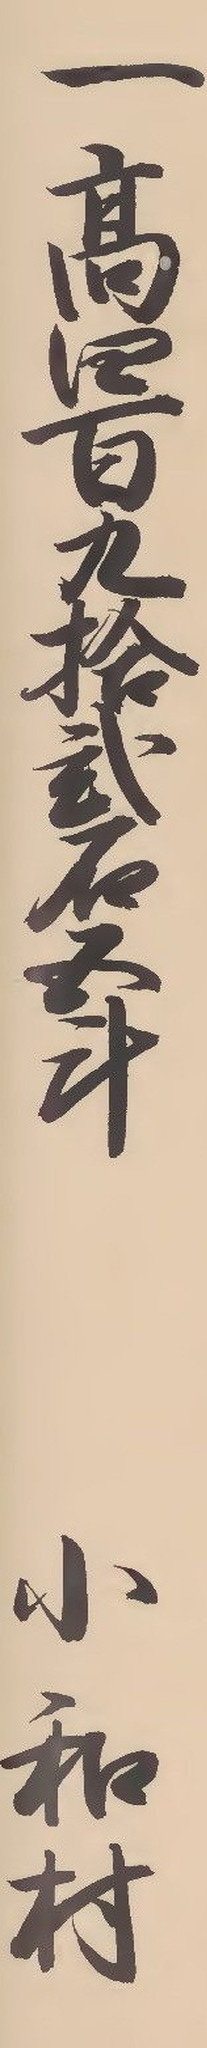一高四百九拾弐石五斗小和村
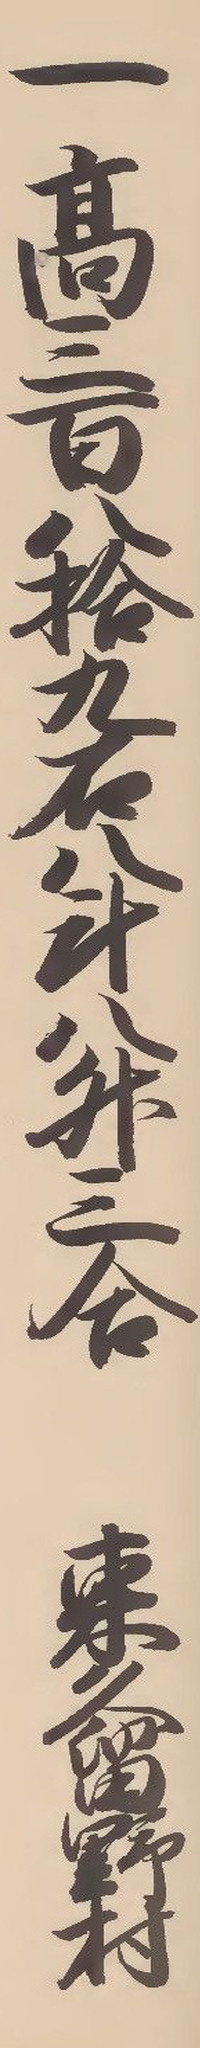一高三百八拾九石八斗八升三合東久留野村
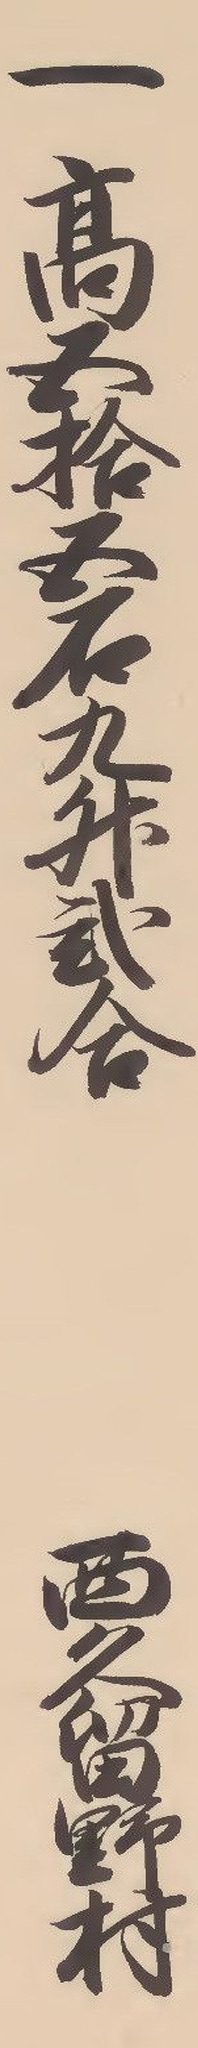一高五拾五石九升弐合西久留野村
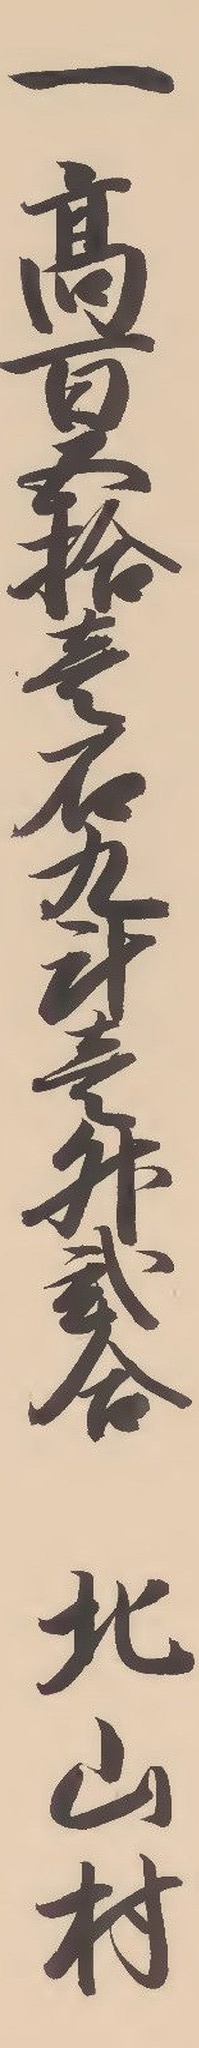一高百五拾壱石九斗壱升弐合北山村
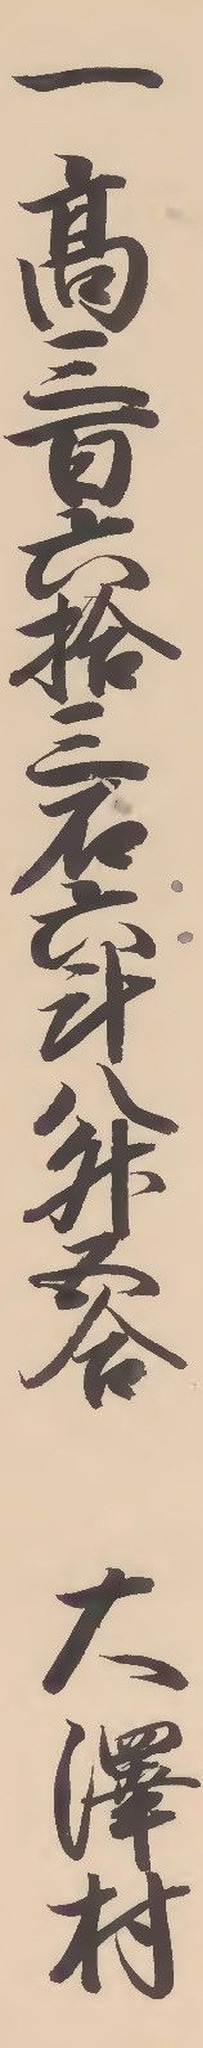一高三百六拾三石六斗八升五合大沢村

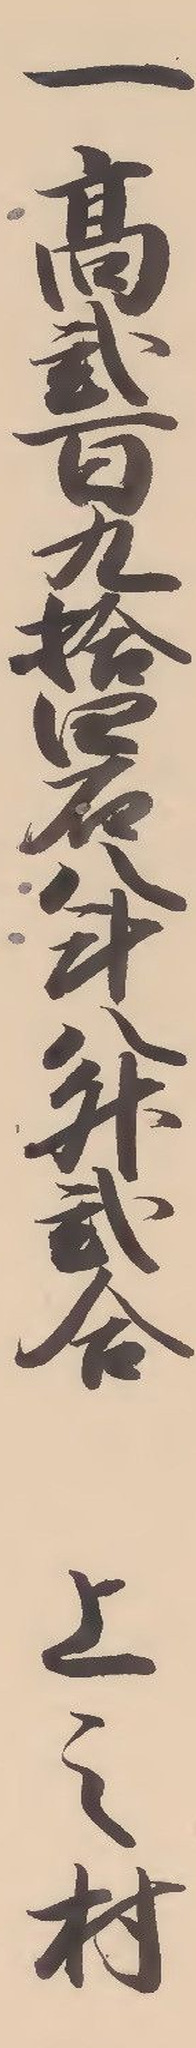一高弐百九拾四石八斗八升弐合上之村
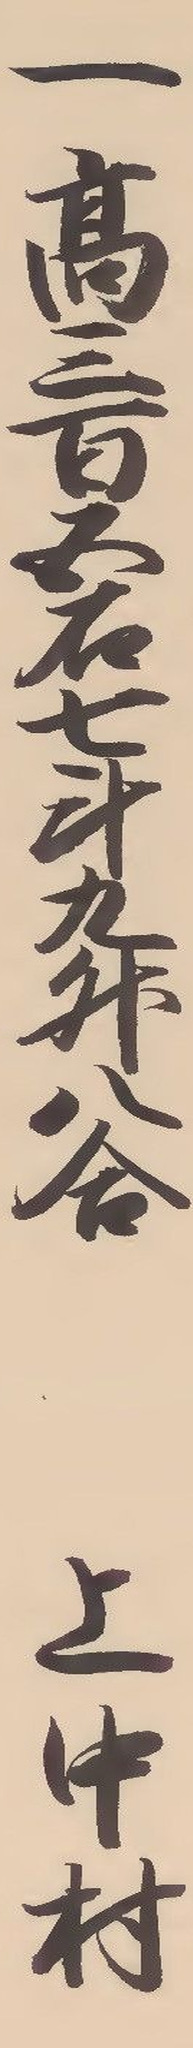一高三百五石七斗九升八合上中村
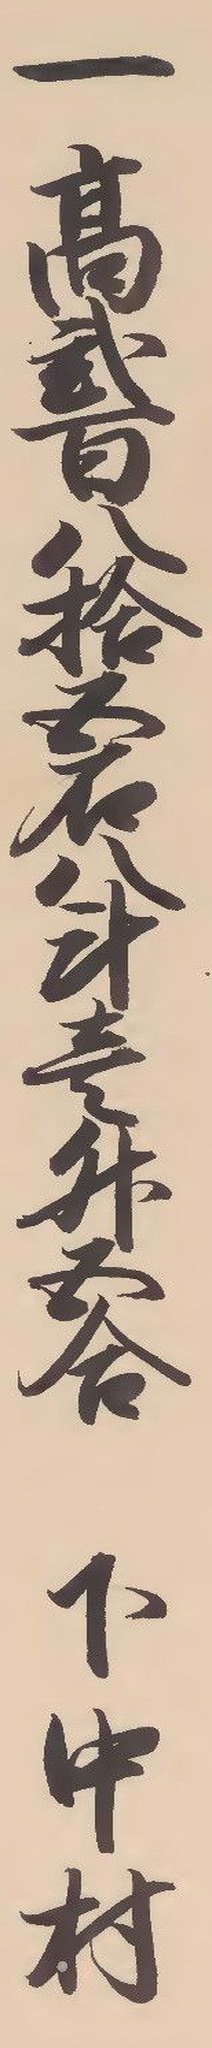一高弐百八拾五石八斗壱升五合下中村
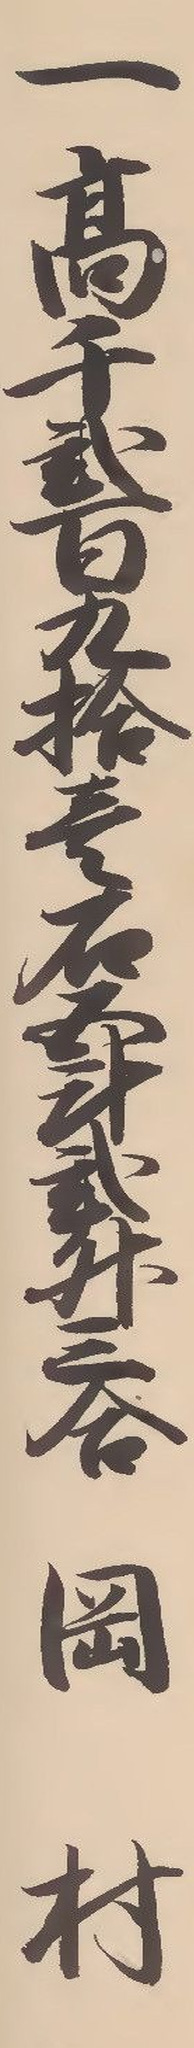一高千弐百九拾壱石五斗弐升三合岡村
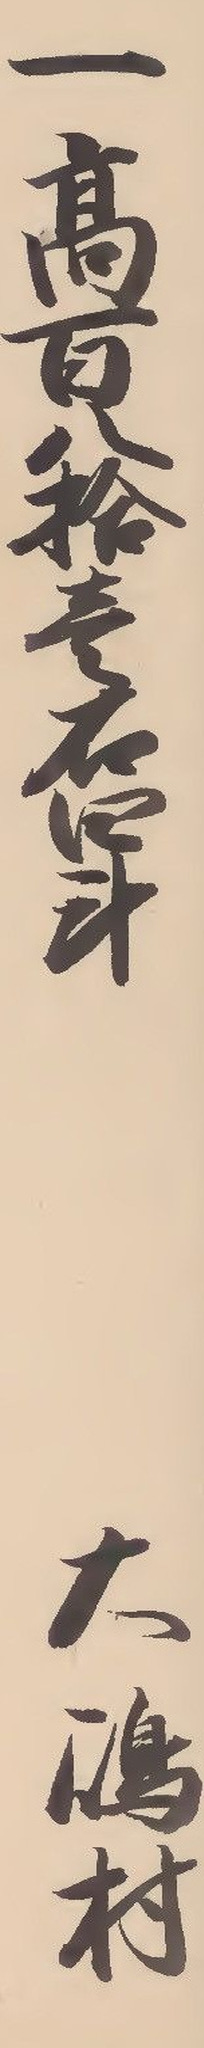一高百八拾壱石四斗大島村
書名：大和国郷帳
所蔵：国立公文書館 National Archives of Japan
